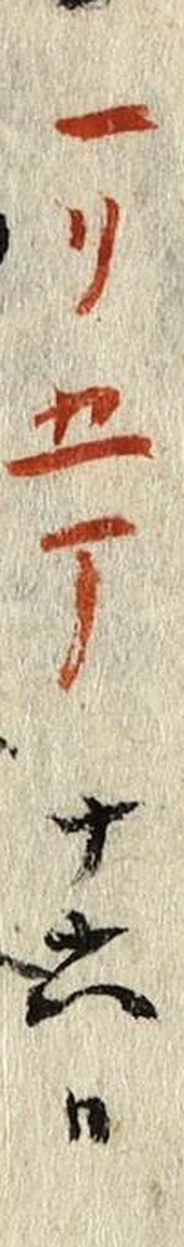一り五丁十六日
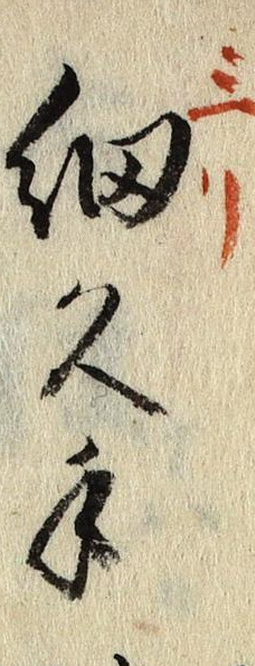細久手
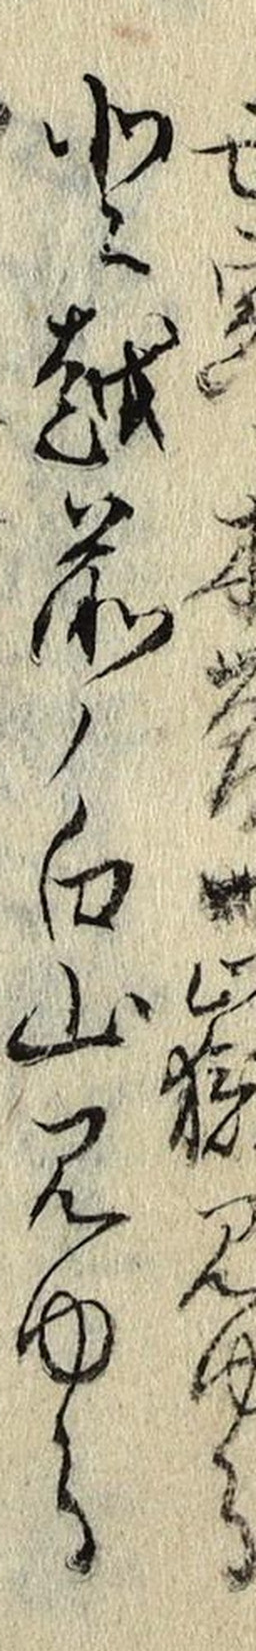北ニ越前ノ白山見ゆる
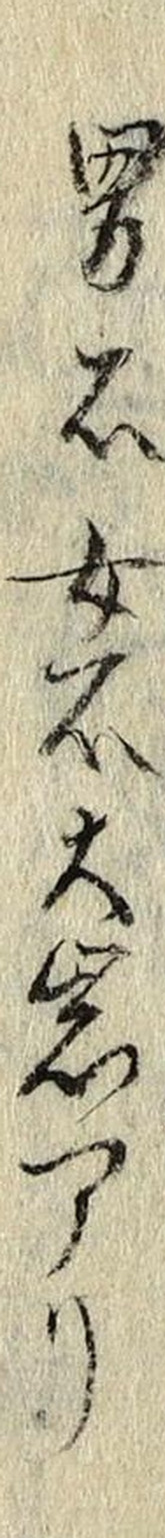男石女石大岩アリ
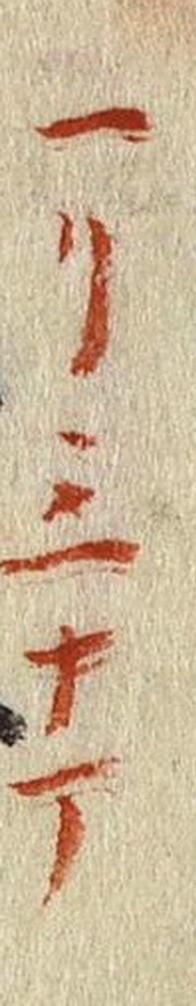一り三十丁
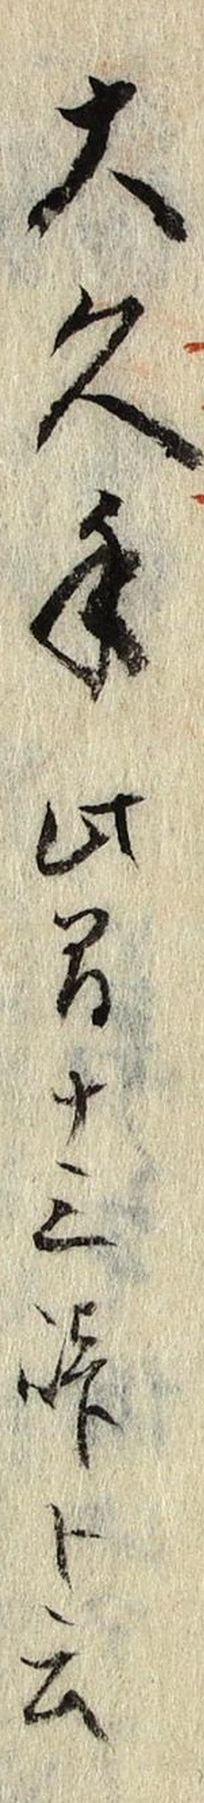大久手此間十三峠ト云
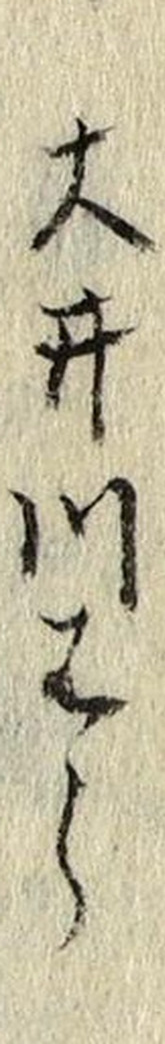大井川はし
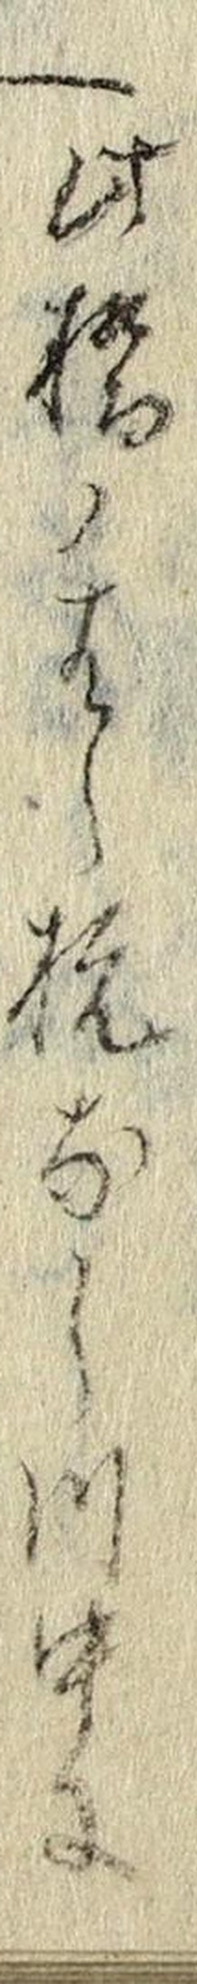此橋ノはし杭なし川中に
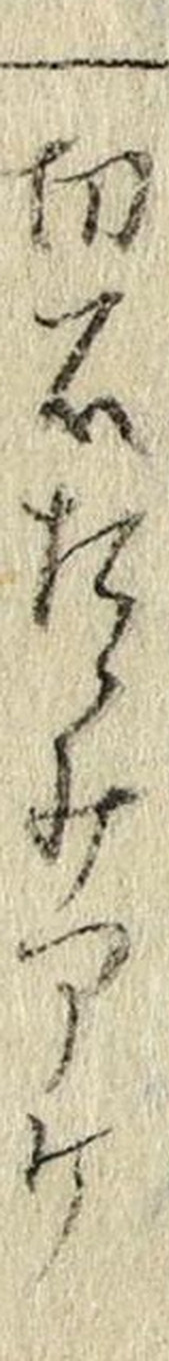切石たゝみアケ
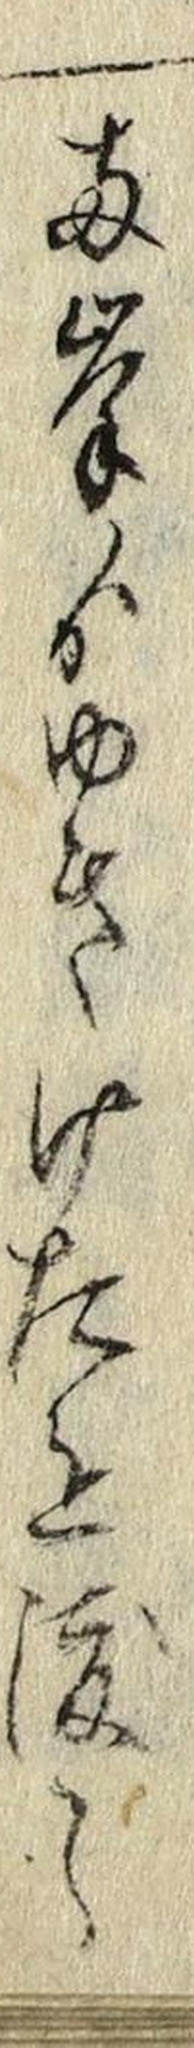両岸ゟゆきけたを渡し
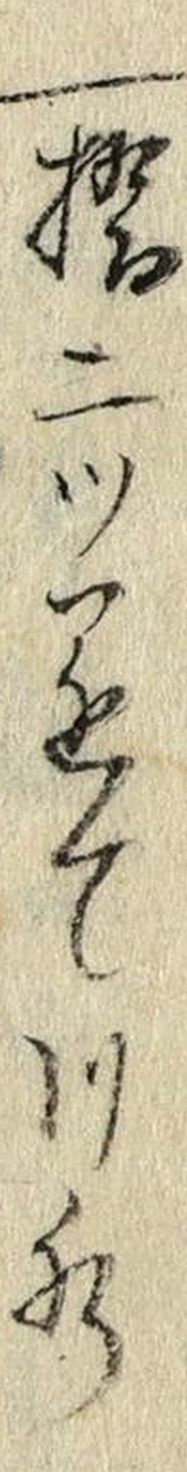橋二ツ懸て川水
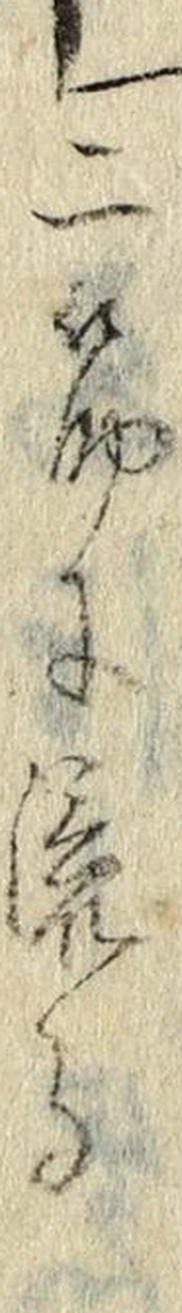二筋に流る

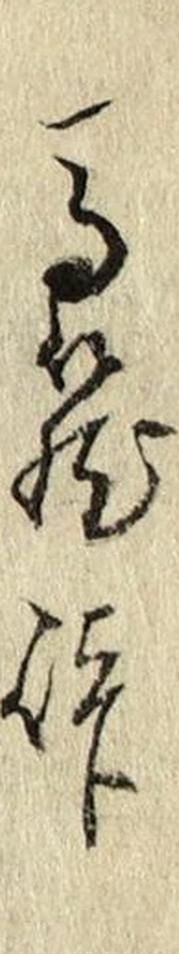馬籠峠
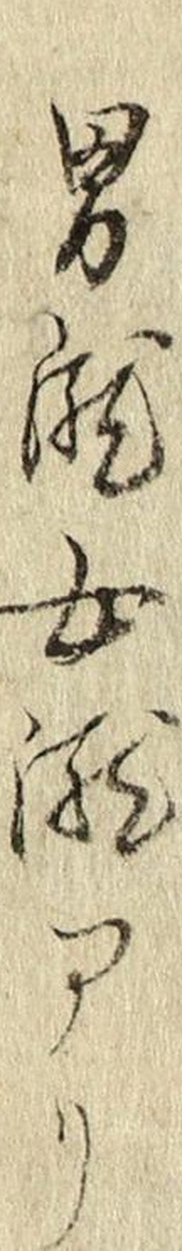男瀧女瀧アリ
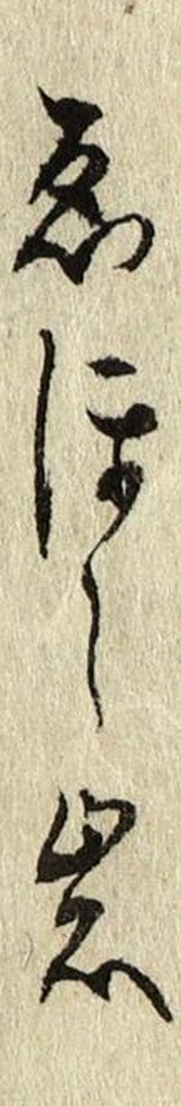ゑほし岩
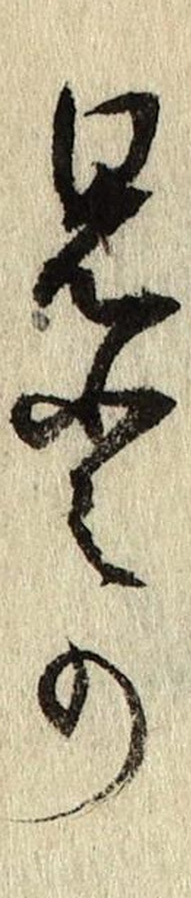見登の
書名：中仙道道中覚
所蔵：福井県文書館 Fukui Prefectural Archives
